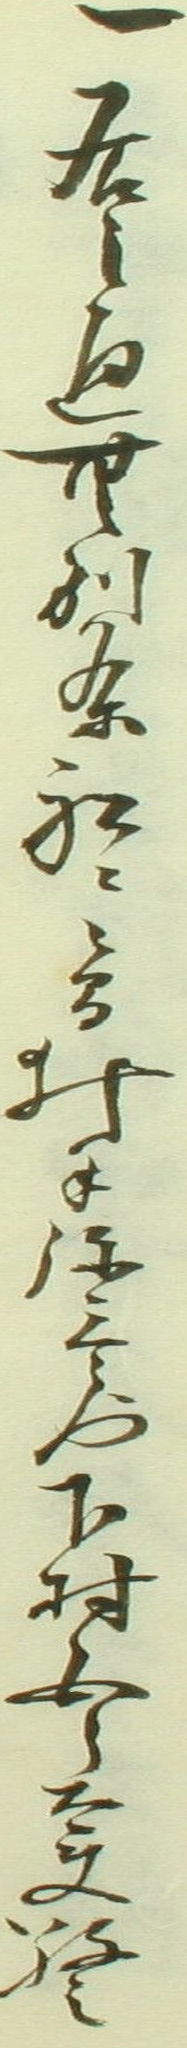一左之通無別条船ニ候間井手弥三右衛門下村五郎太夫警
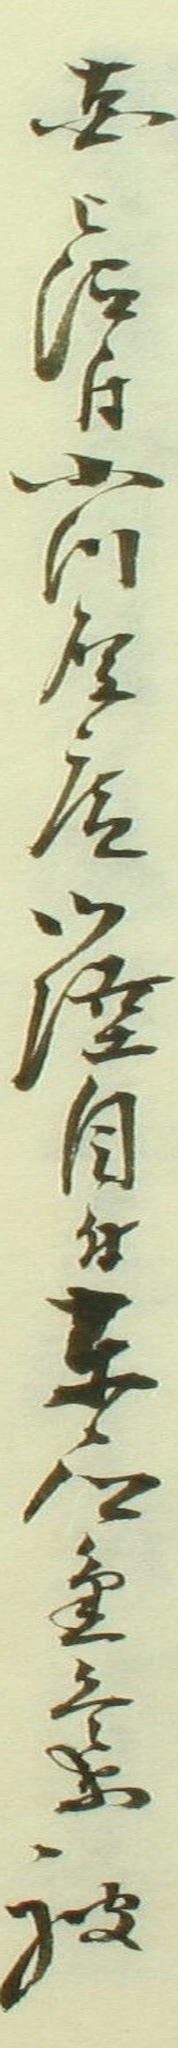固被仰付小川厚庵御陸目付東郷金兵衛被
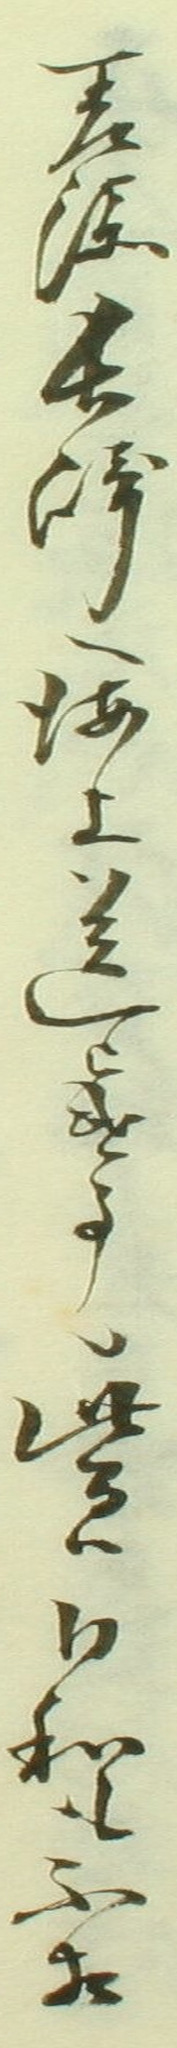差添長崎へ海上送被遣事候此者日和も不相
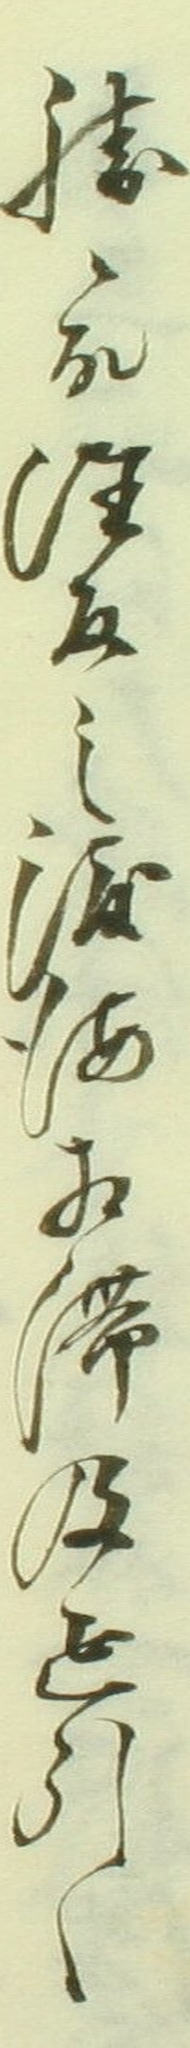勝候故往反之渡海相滞及延引候
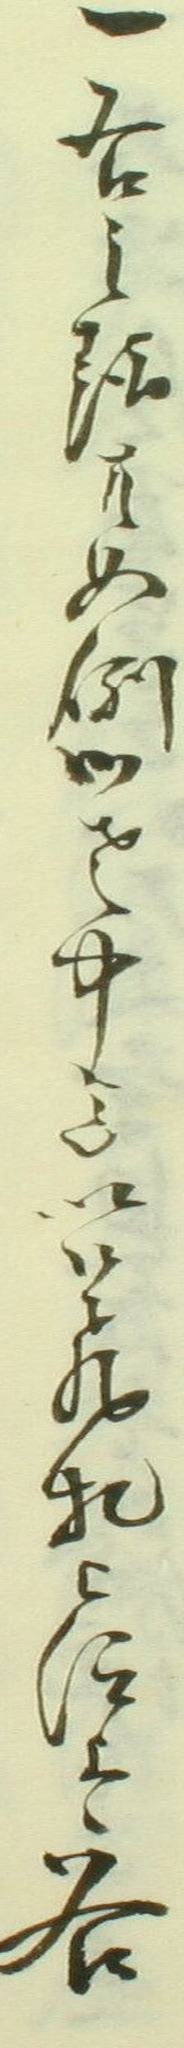一右之趣共如例御老中迄以御飛札被仰上候各
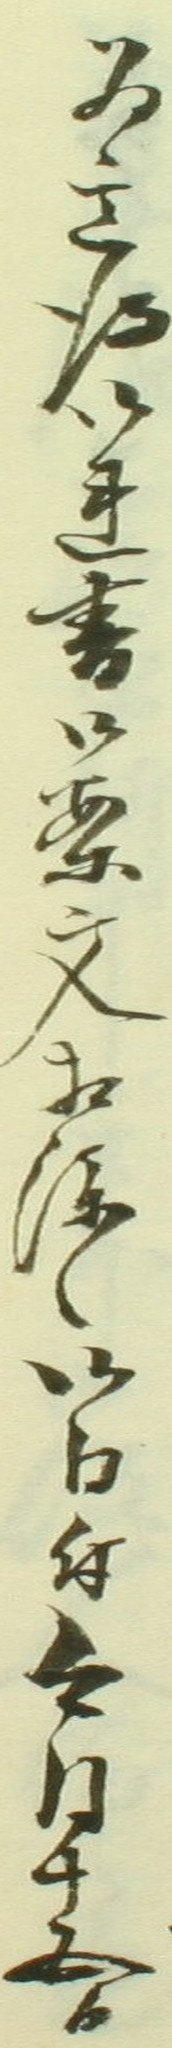為意得御連書御案文相添候御日付今月十五日
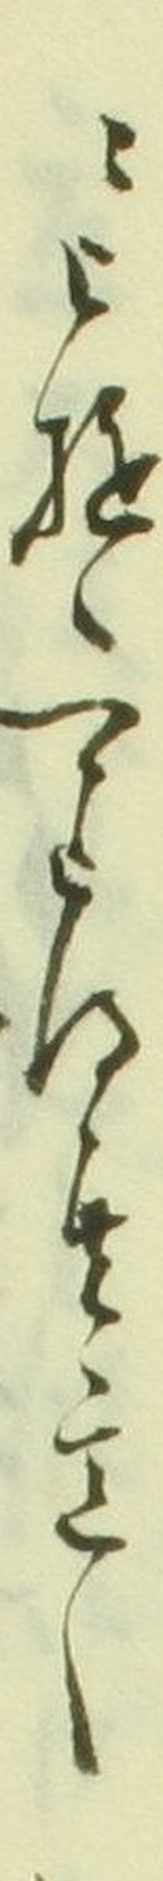と被遊候可被得其意候
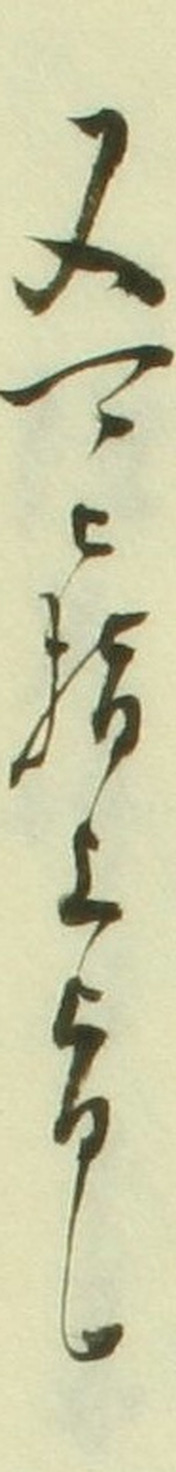又可被指上旨候
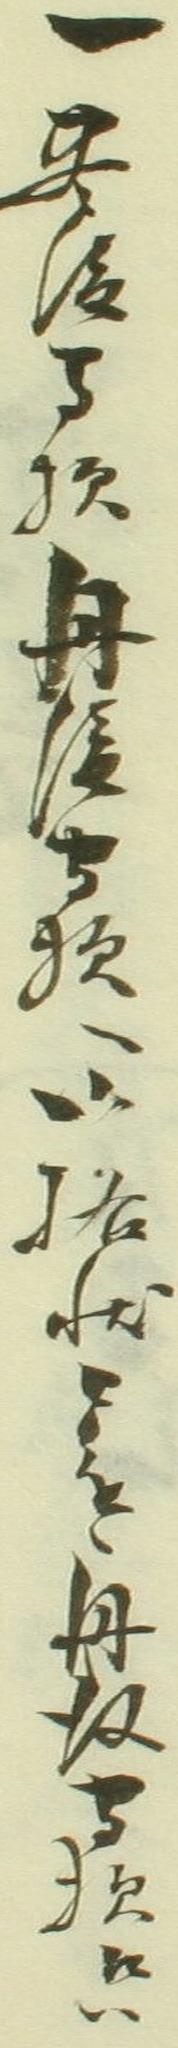一豊後守様丹後守様へ御格状被進候丹後守様江ハ
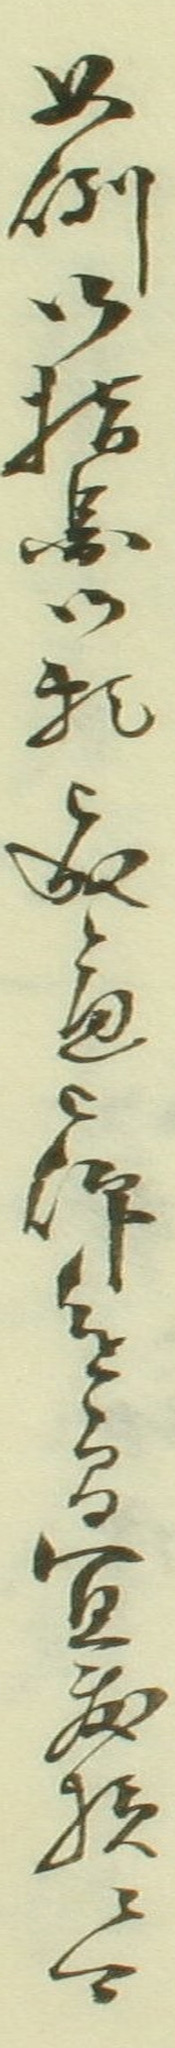如例御指図御頼被成候通被仰進候間宜敷様ニ可
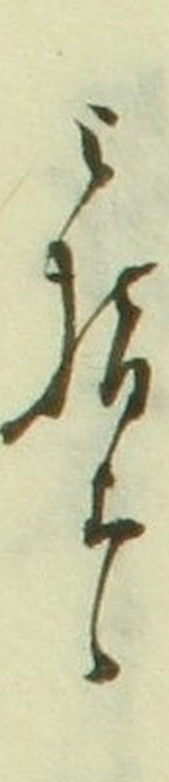被指上候
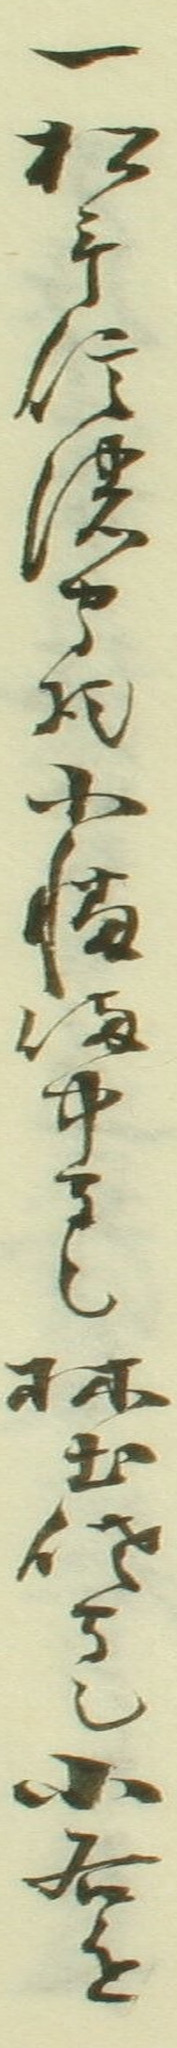一松平信濃守様小幡備中守殿林土佐守殿小右進
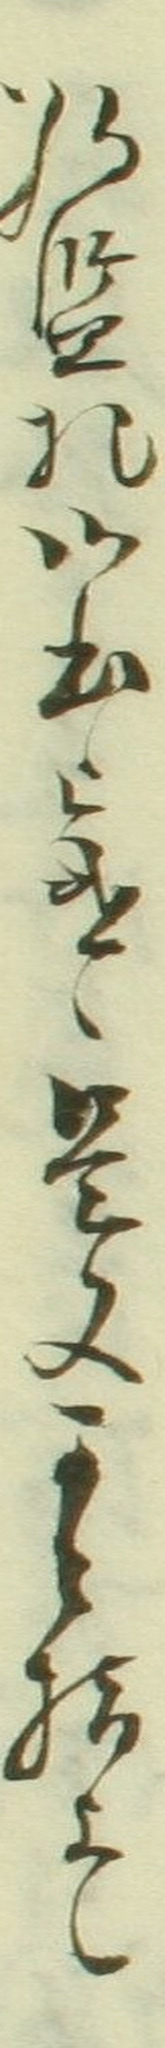将監様御出被遣候是又可被指上候
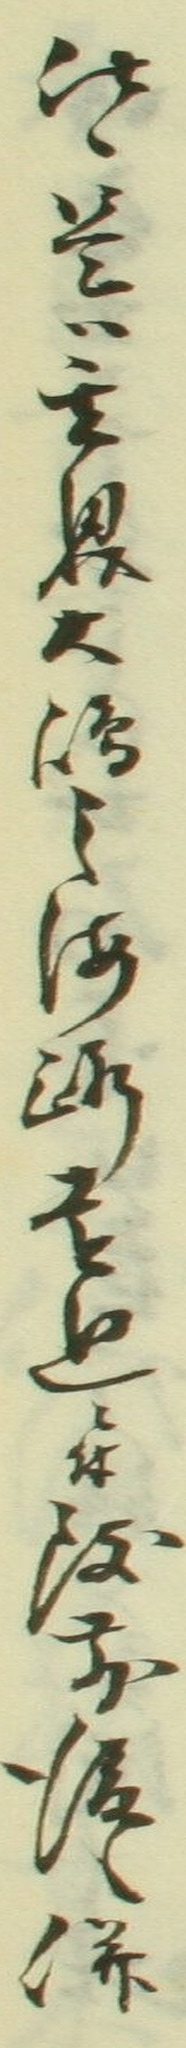仕候是ハ玄海大嶋之海路遠廻ニ付致前後候併

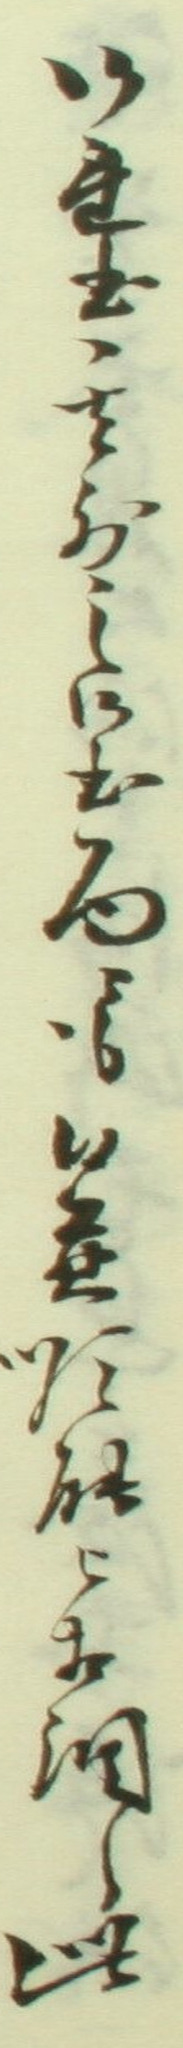御連書其前之書面ニも御並順能被相調候此
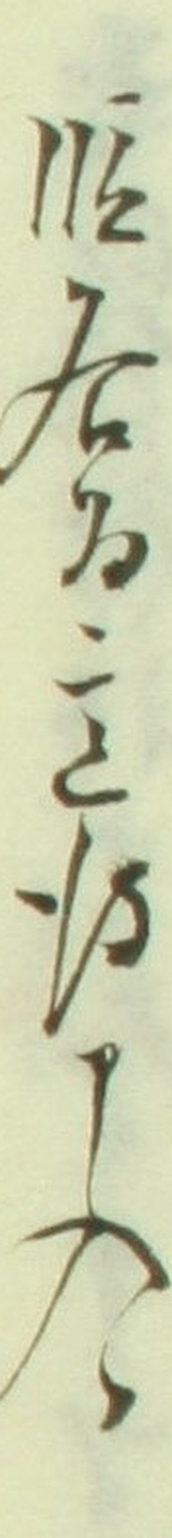段各為意得申入候
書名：異国船漂着記
